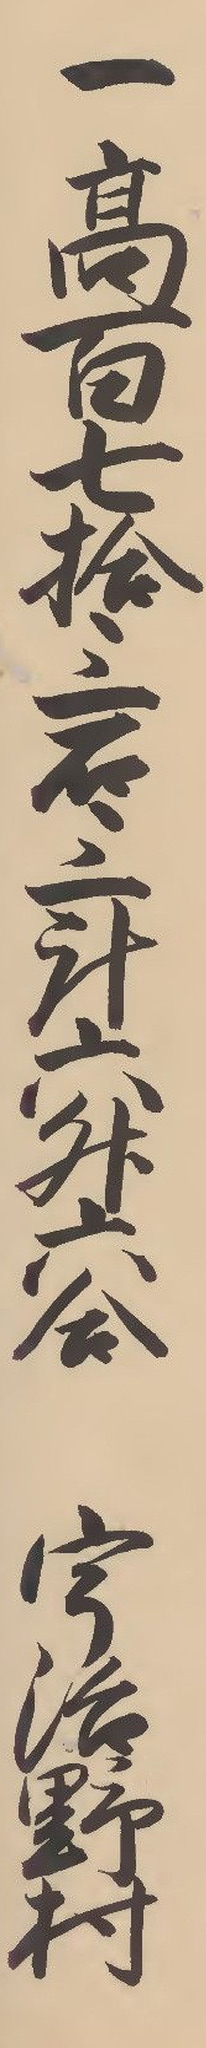一高百七拾三石三斗六升六合宇治野村
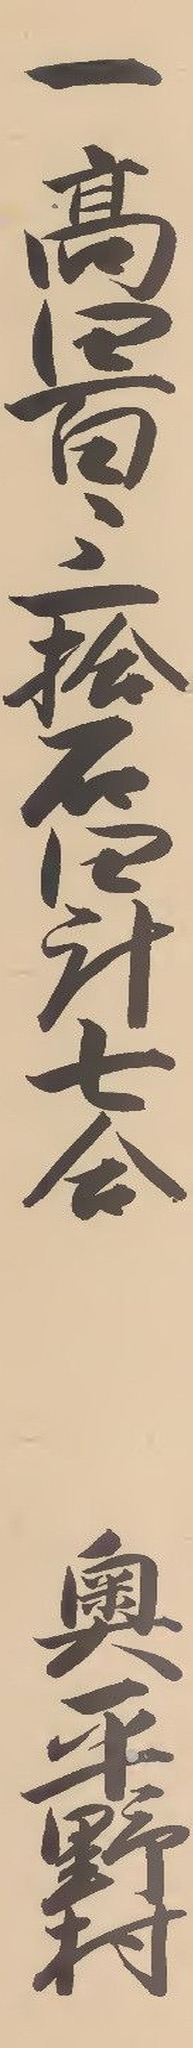一高四百三拾石四斗七合奥平野村
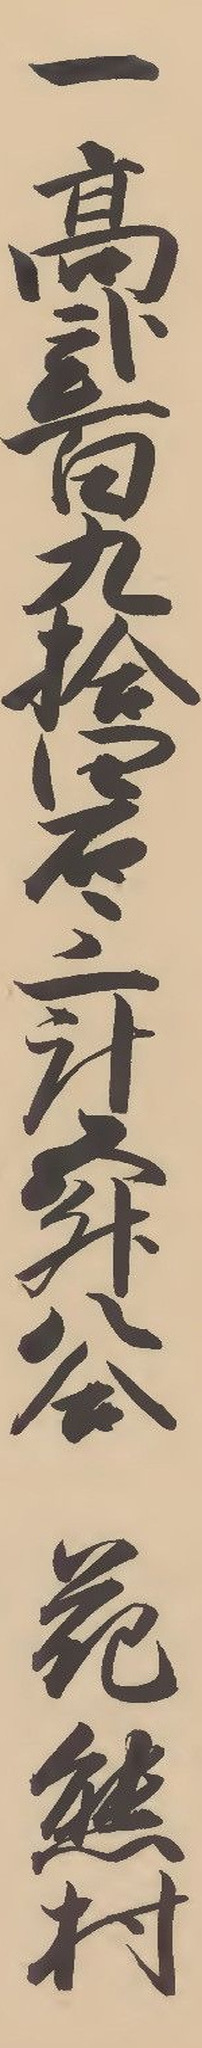一高弍百九拾四石三斗五升八合花熊村
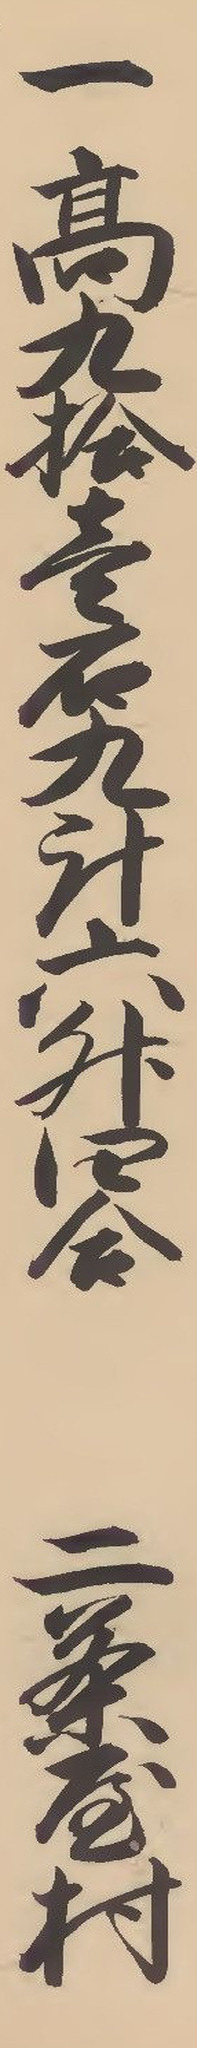一高九拾壱石九斗六升四合二茶屋村

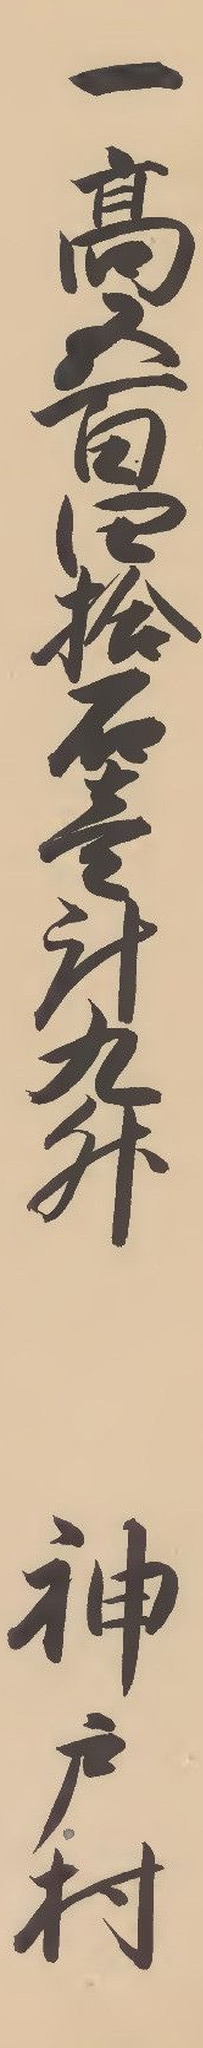一高五百四拾石壱斗九升神戸村
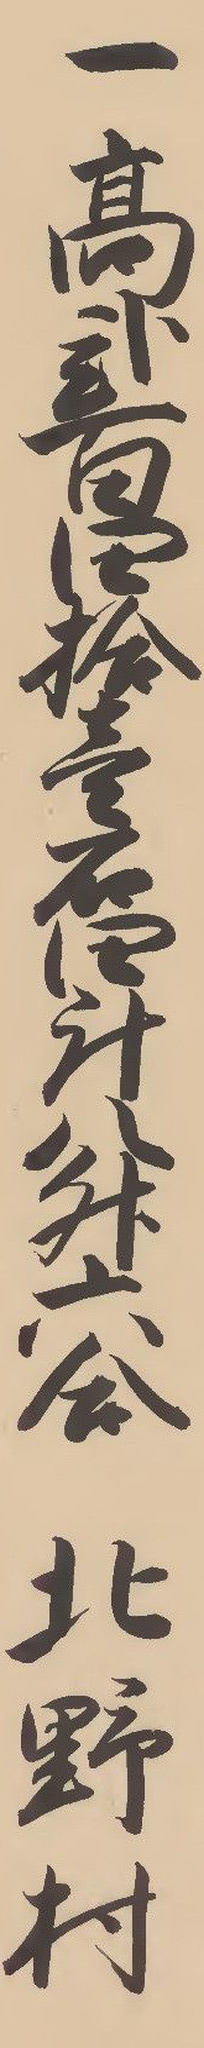一高弐百四拾壱石四斗八升六合北野村
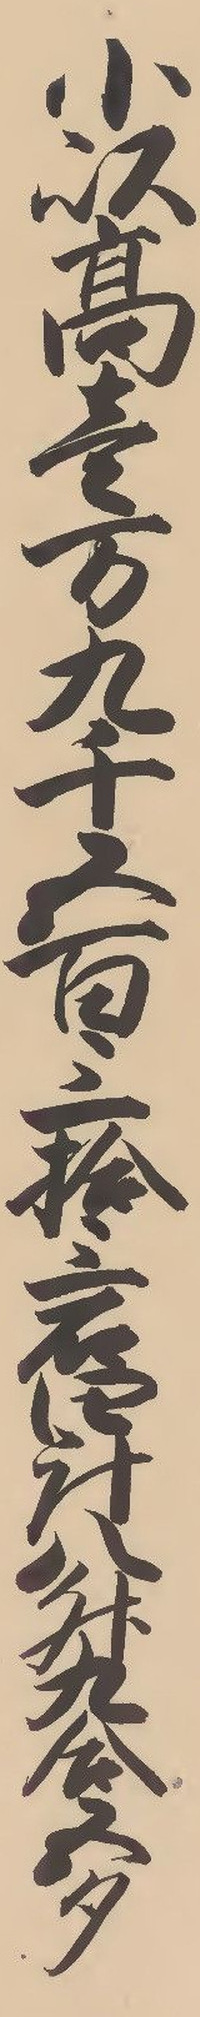小以高壱万九千五百三拾三石四斗八升九合五勺
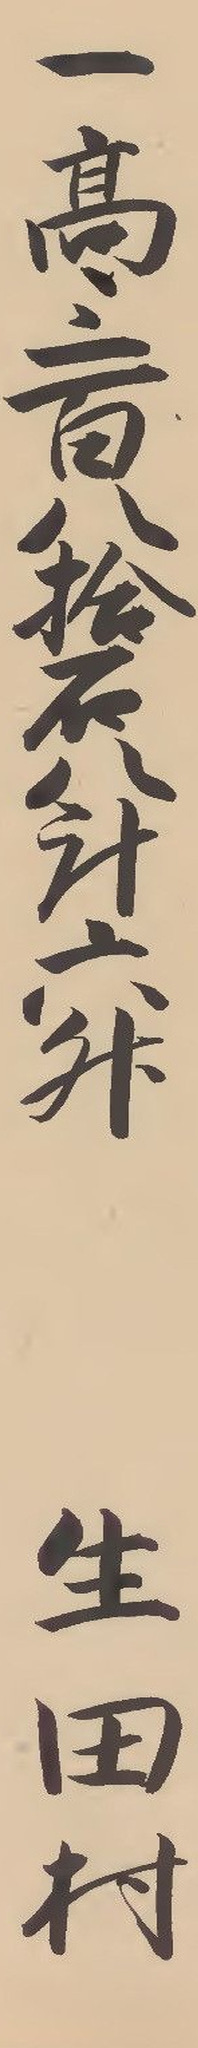一高三百八拾石八斗六升生田村
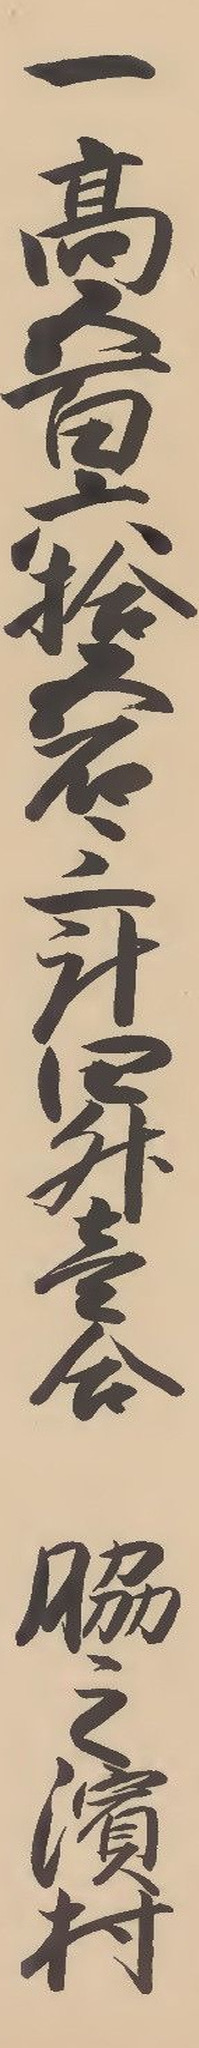一高五百六拾五石三斗四升壱合脇之浜村
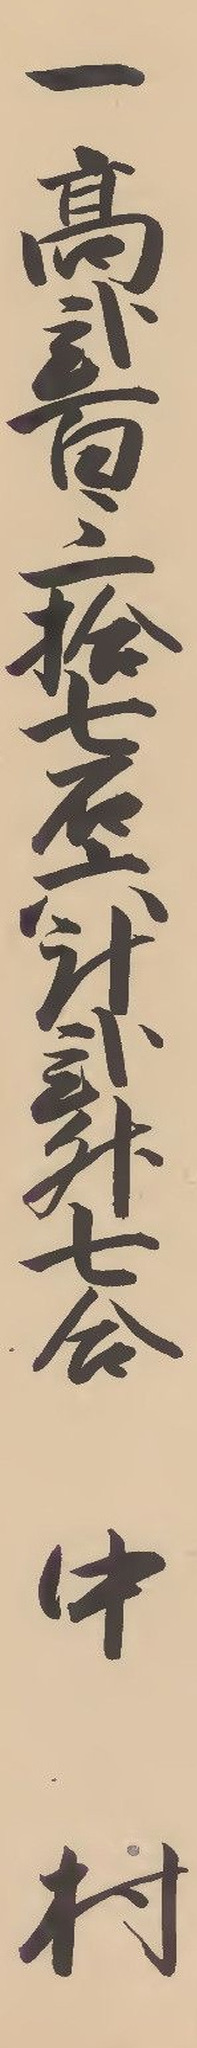一高弐百三拾七石六斗弐升七合中村

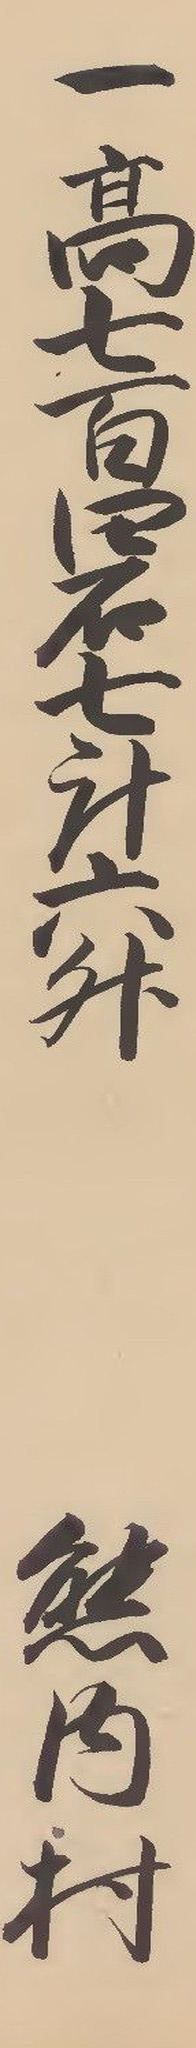一高七百四石七斗六升熊内村
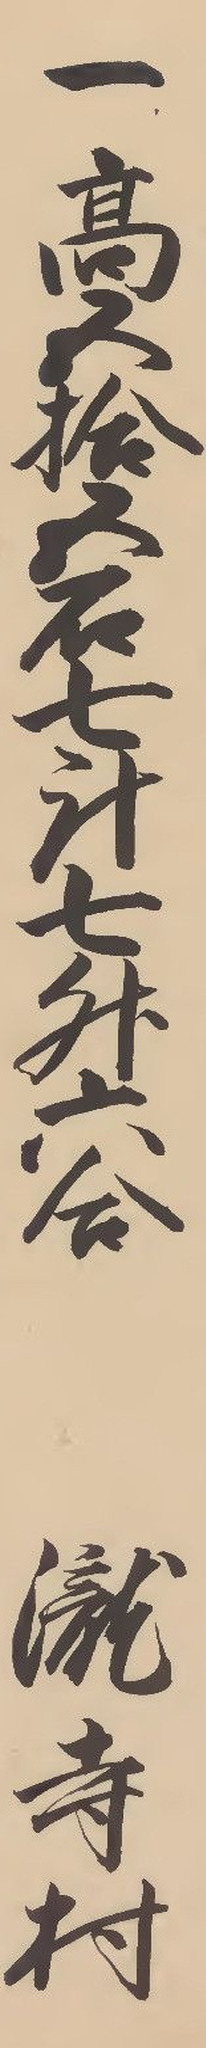一高五拾五石七斗七升六合滝寺村
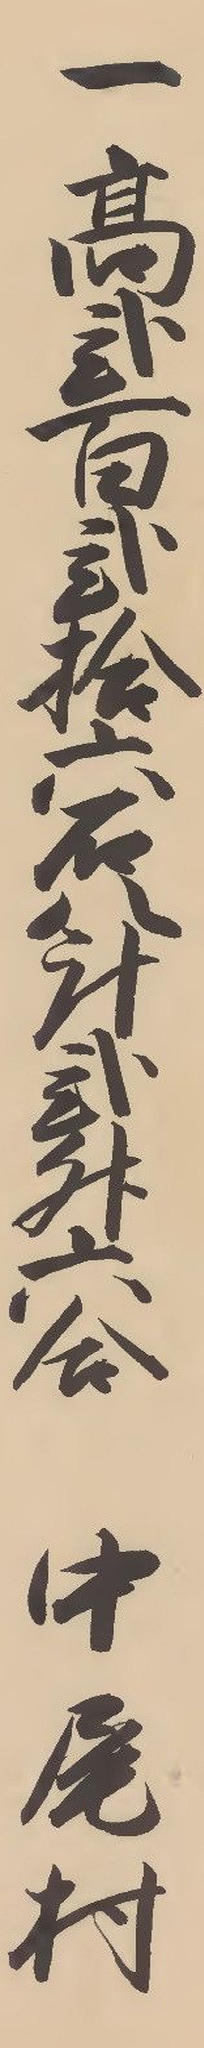一高弍百弐拾六石八斗弐升六合中尾村
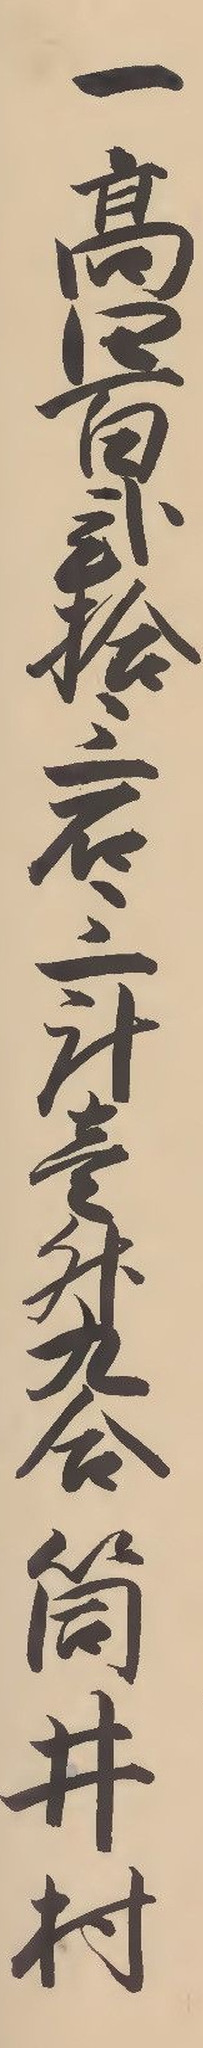一高四百弐拾三石三斗壱升九合筒井村
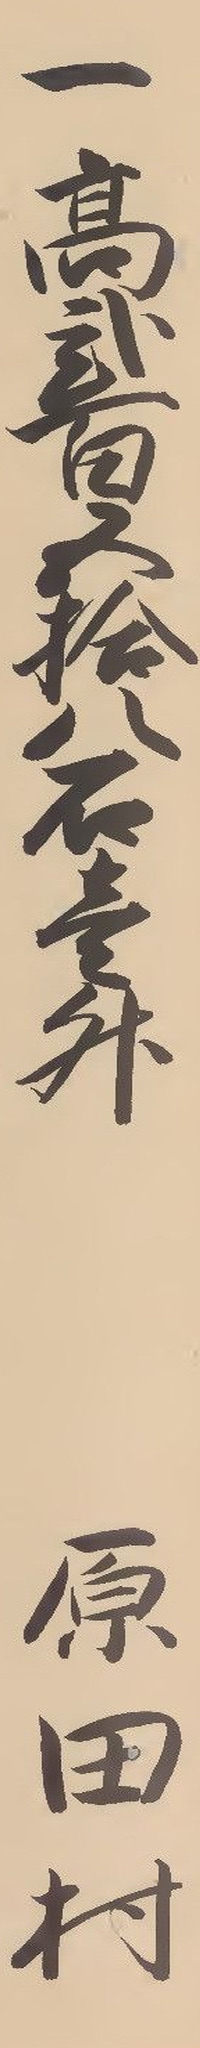一高二百五拾八石壱升原田村
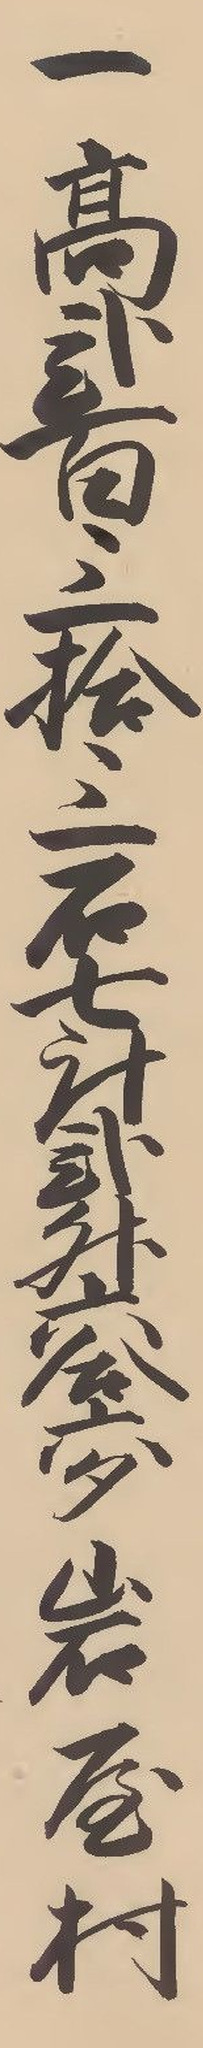一高弍百三拾三石七斗弐升六合六勺岩屋村
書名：摂津国郷帳
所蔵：国立公文書館 National Archives of Japan
